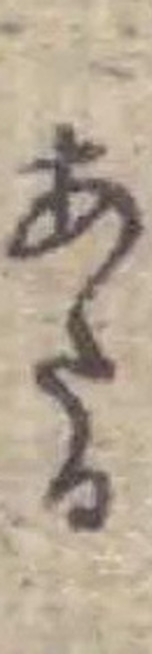あたる
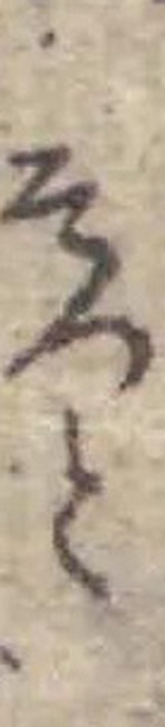そつと
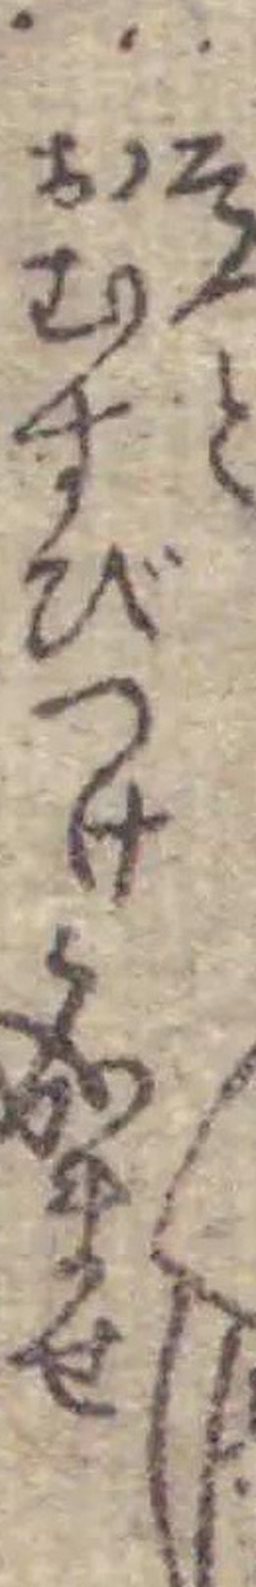おむすびつけ被成ませ
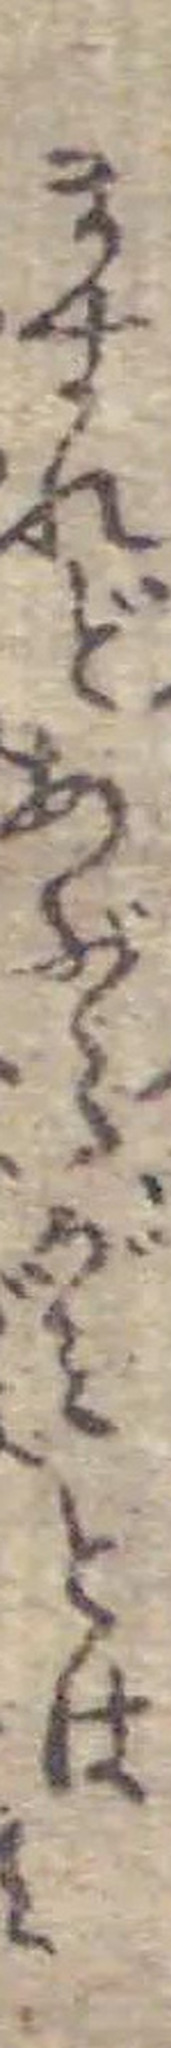ますれどあぶらがみとは
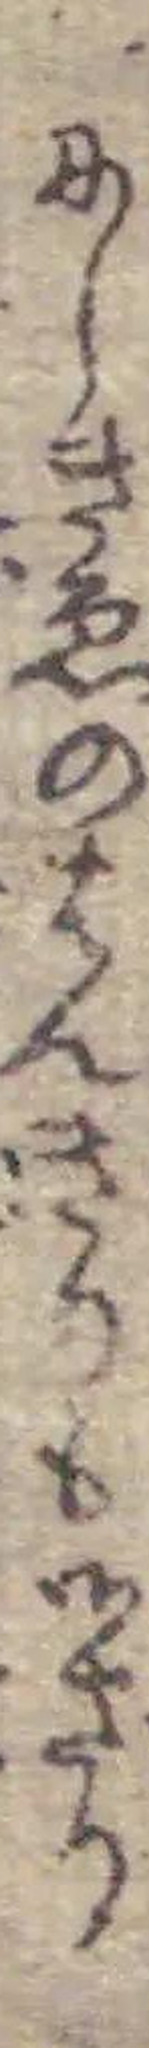にしきゑのはんきりも御ざり
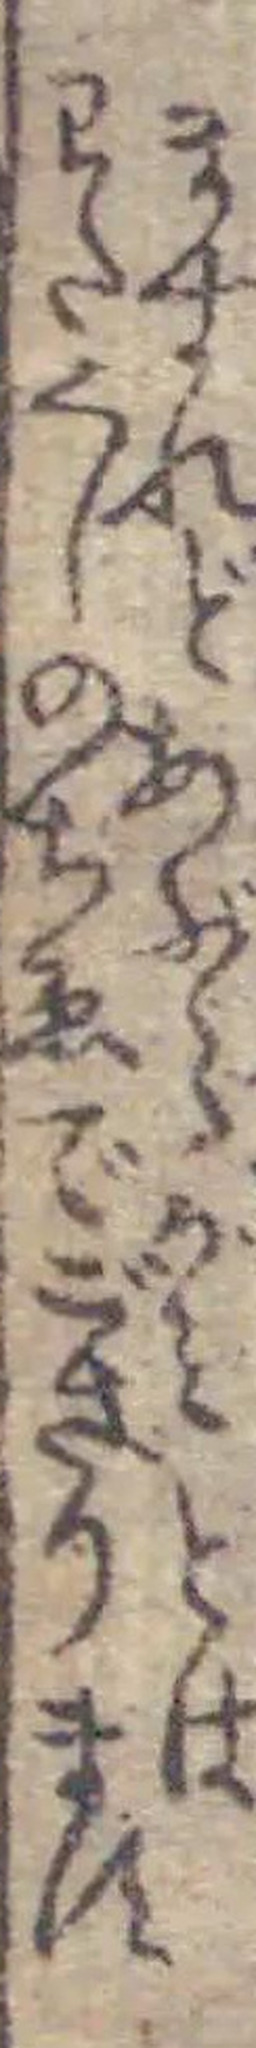わたくしのちゑでごさります

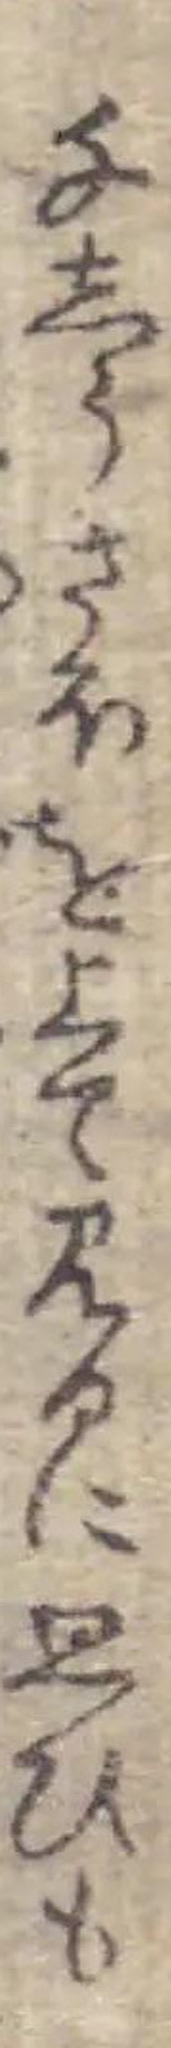千しうさほを上て見るに思ひも
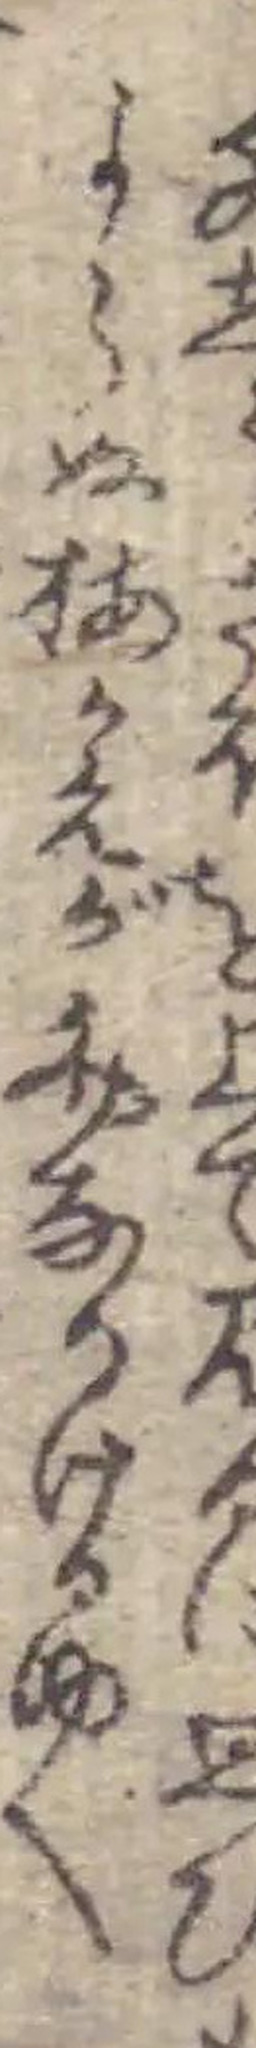よらぬ梅かえが文なりけるゆへ
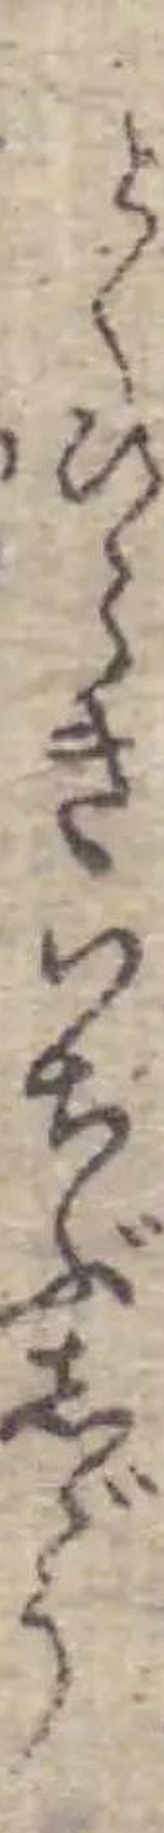とくひらきいちぶしゞう
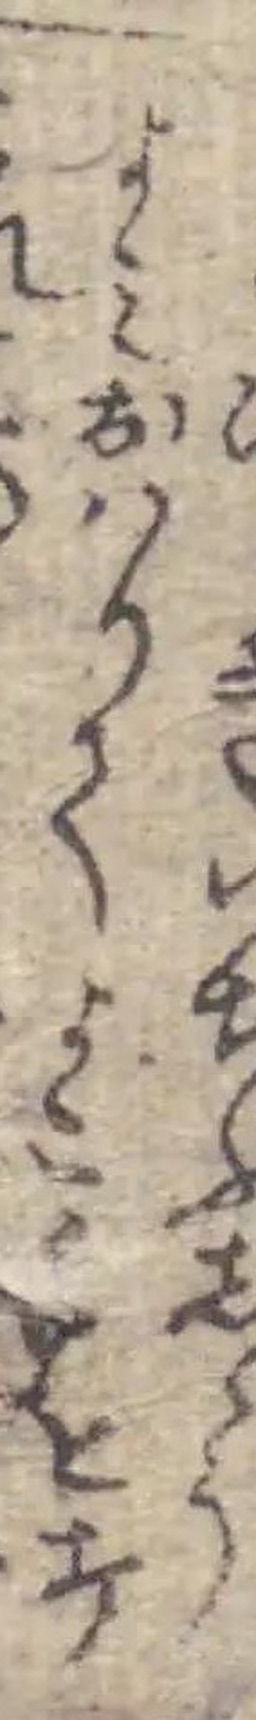よみおはりてよこ手を打
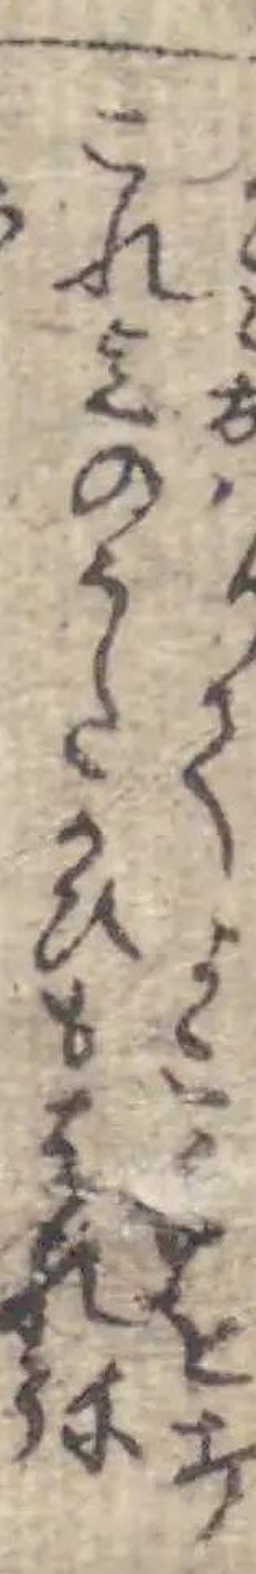これ迄のうたかひもはれ彌
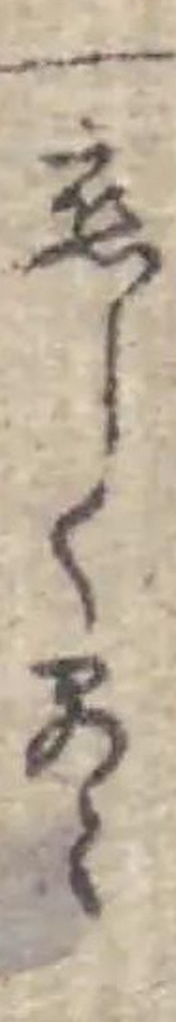恋しく早々
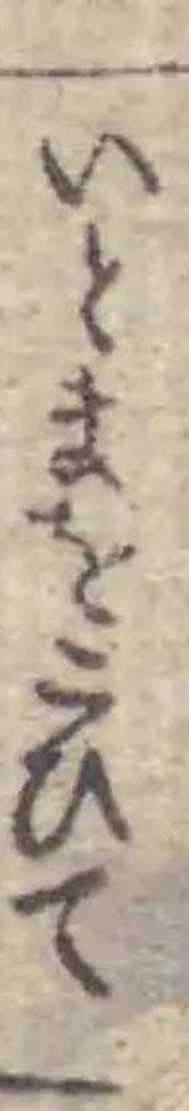いとまをこひて
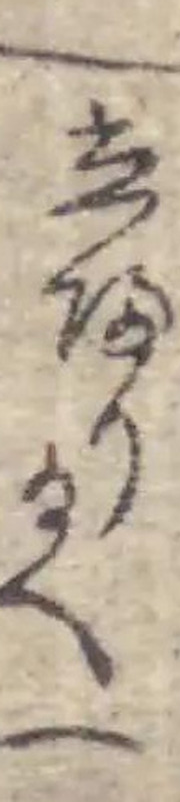立帰り給へ
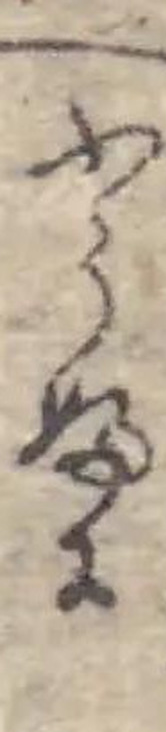ふうふに
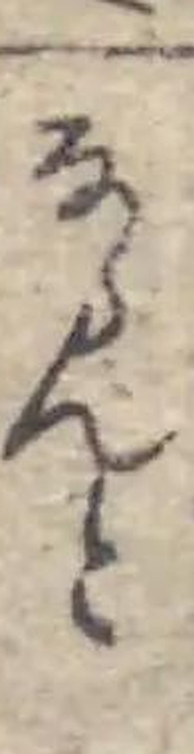ならんと
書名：見立蓬莱 : 2巻
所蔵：国立国会図書館 National Diet Library, JAPAN
